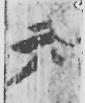亓
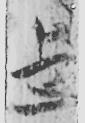上B（上）
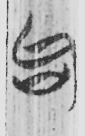句
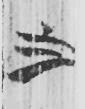之
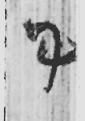身
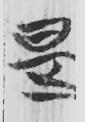是
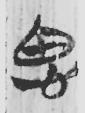思
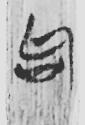句
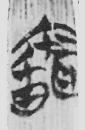䎽
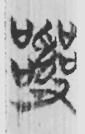{𤔔㗊}（亂）
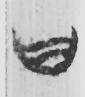甘
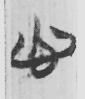心
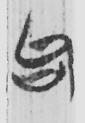句
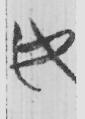女
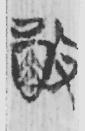{口𠀬攴}
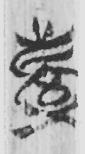{鹿至}
